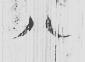八
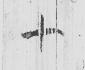七
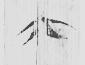六
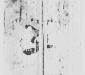五
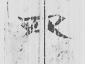四
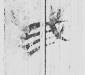弎
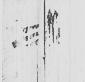弍
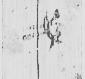弌
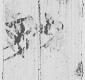{𦚏刀}
